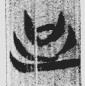足
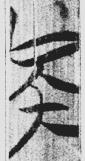矣
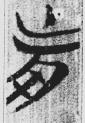歬（前）
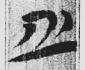之
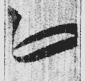㠯（以）
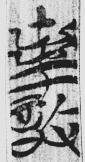讓
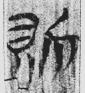則
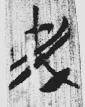民
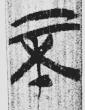不
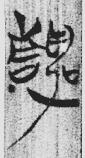靜（爭）
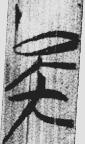矣
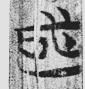或
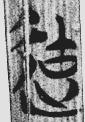迪
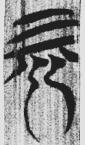而
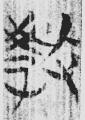教
